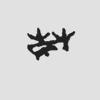莫
